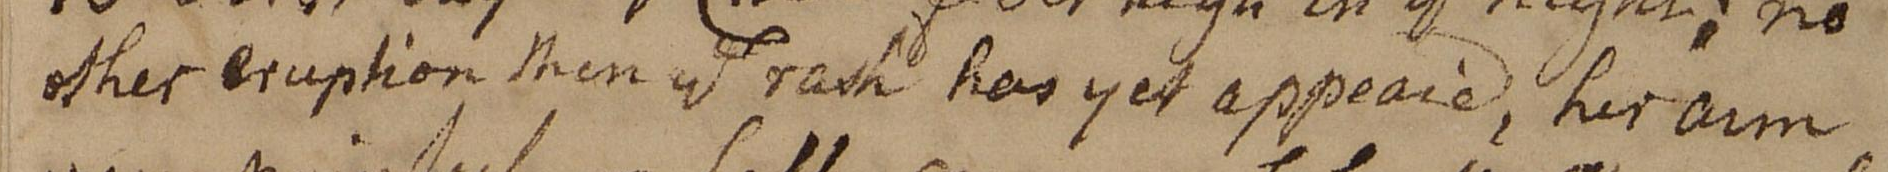other eruption then y^e rash has yet appear'd, her arm
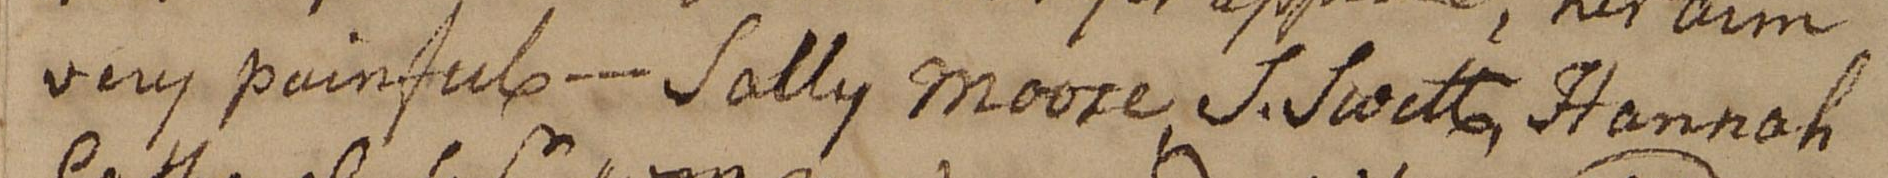very painful- Sally Moore, S. Swett, Hannah
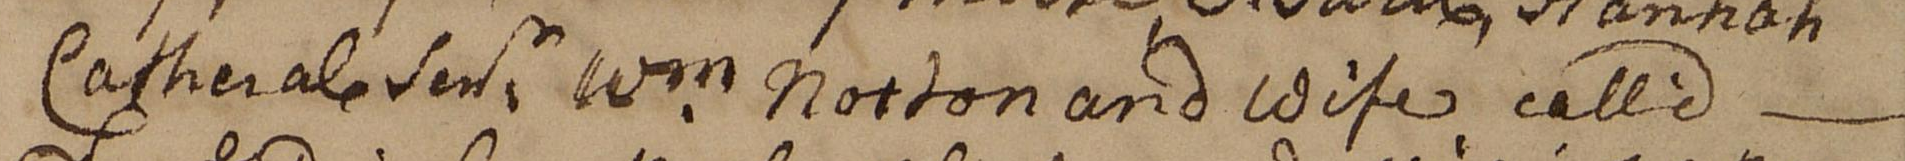Catheral Sen^r. W^m. Norton and wife, call'd-
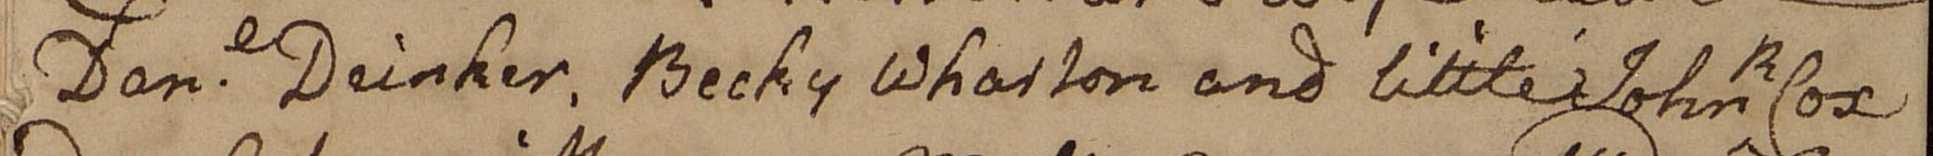Dan^l. Drinker, Becky Wharton and little John ^R Cox
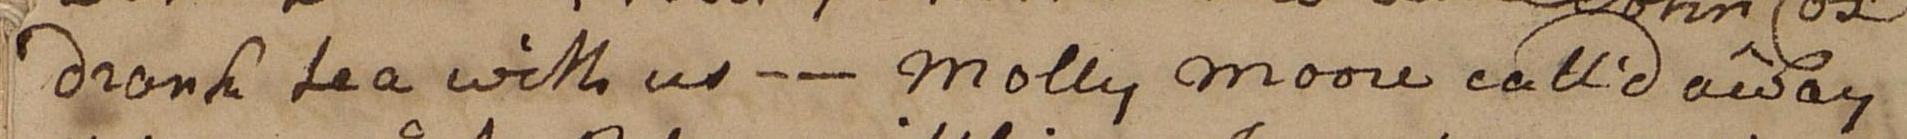drank tea with us-- Molly Moore call'd away
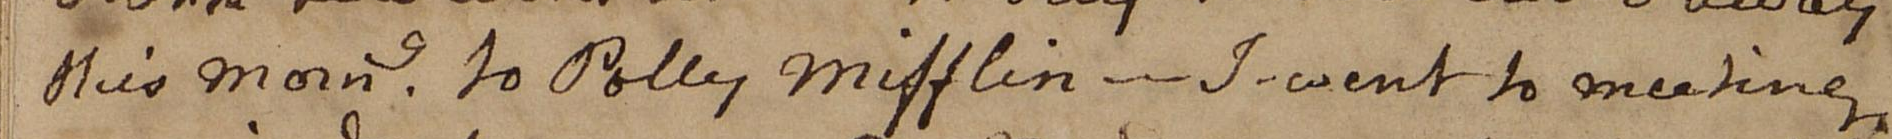this morn^g. To Polly Mifflin- I went to meeting,
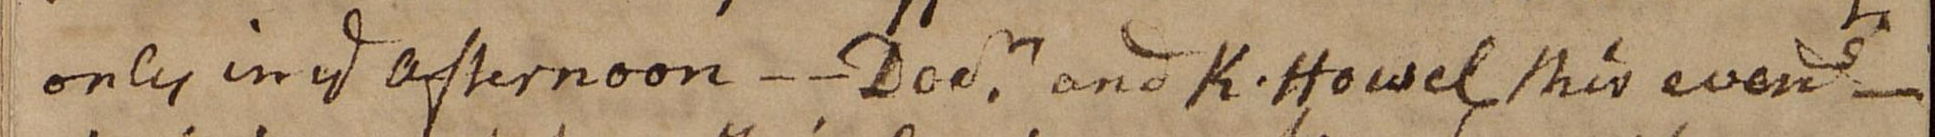only in y^e afternoon-- Doc^r. and K. Howel this even^g-
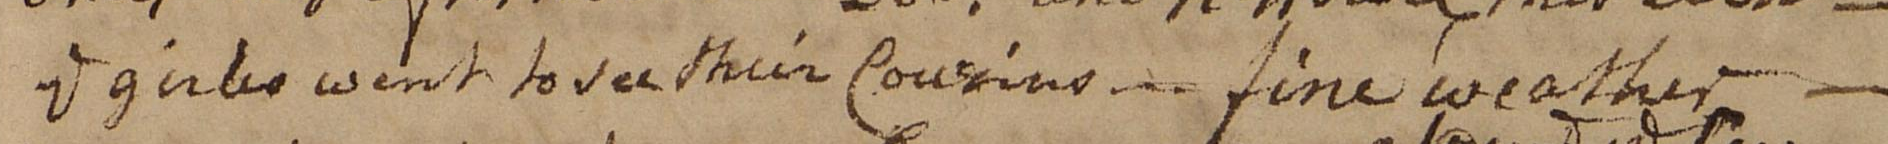y^e girles went to see their Cousins- fine weather-
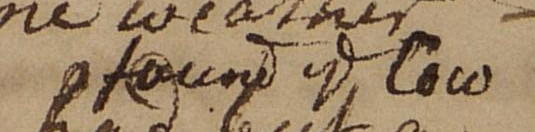found y^e Cow
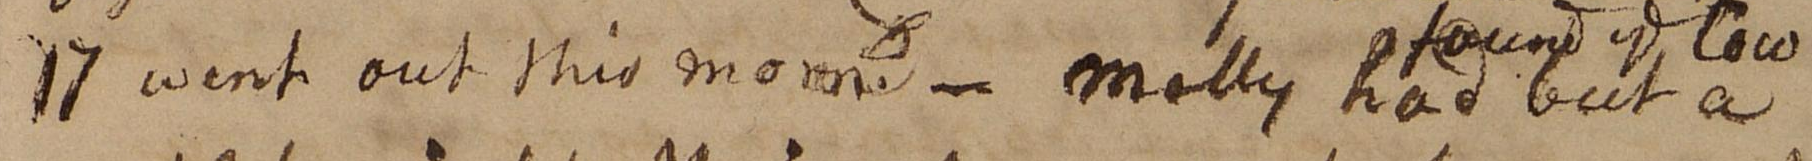17 went out this morn^g.- Molly had but a
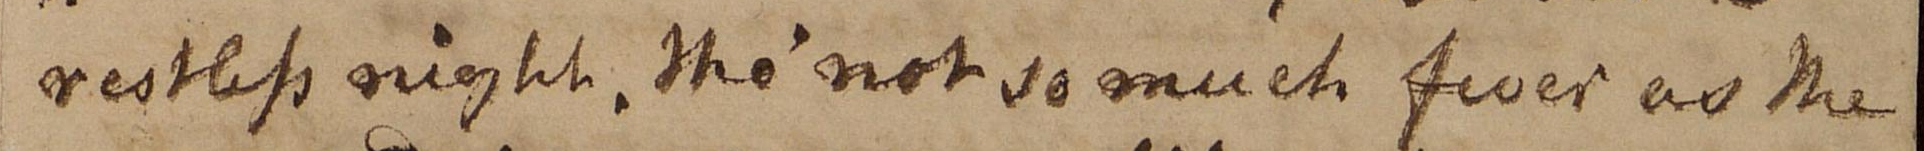restless night, tho' not so much fiver as the
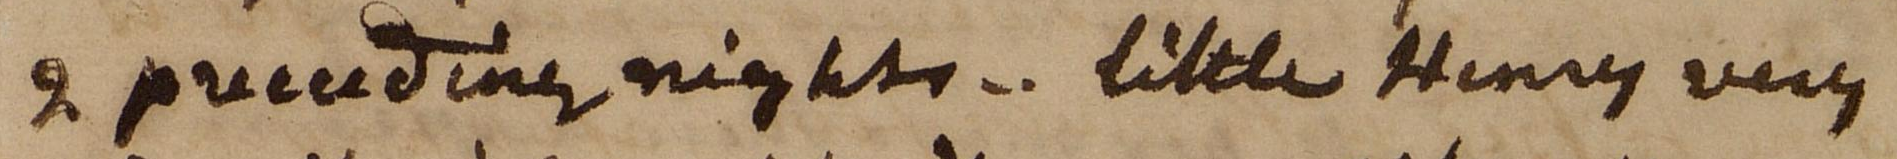2 preceding nights- little Henry very
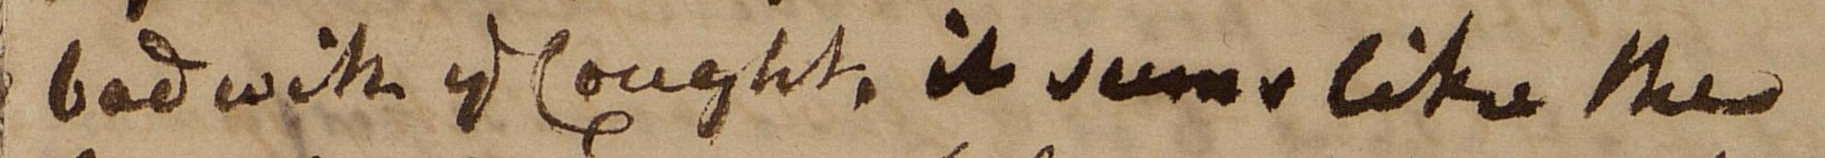bad with y^e Cought, it seems like the
